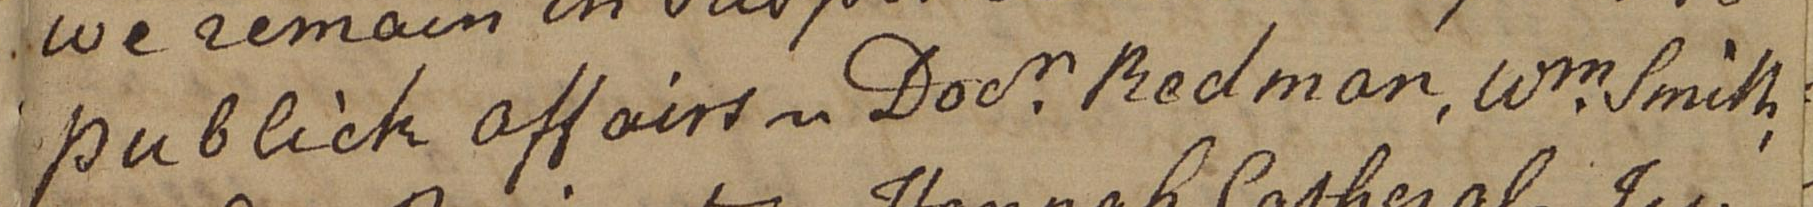publick affairs- a Doc^r. Redman, W^m. Smith
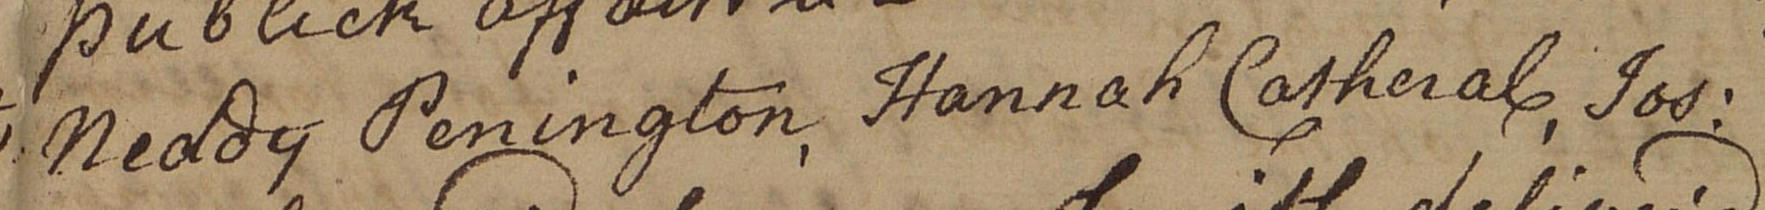Neddy Penington, Hannah Catheral, Jos:
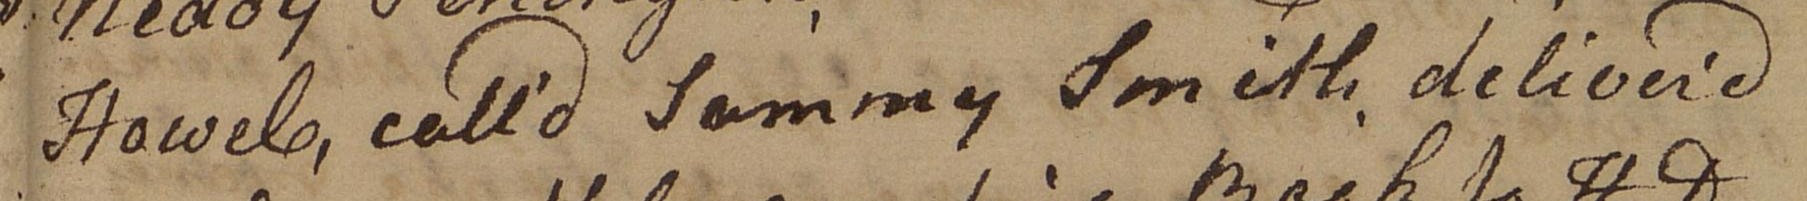Howels, call'd Sammy Smith, deliver'd
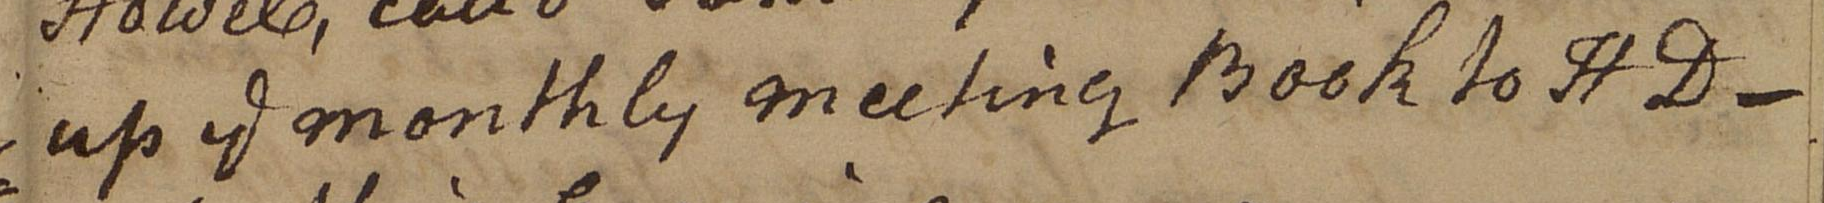up y^e monthly meeting Book to H D-
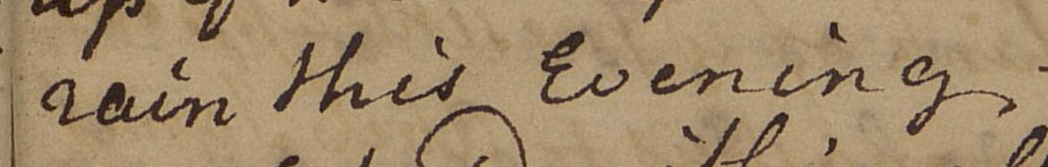rain this Evening
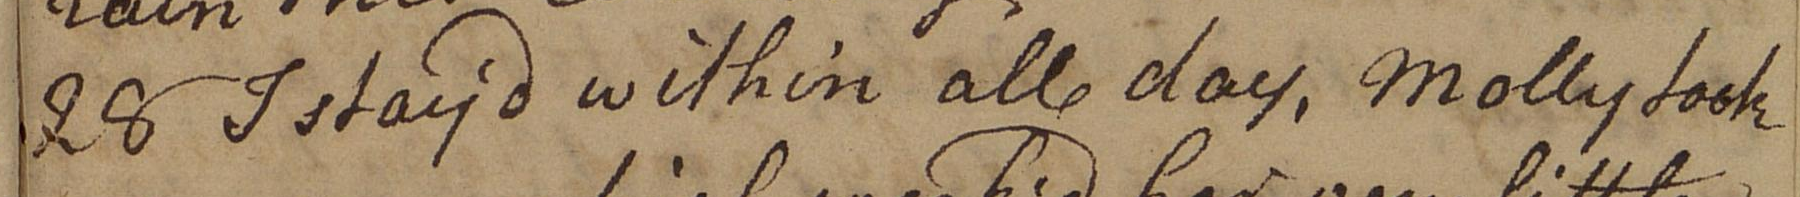28 I stay'd within all day, Molly took
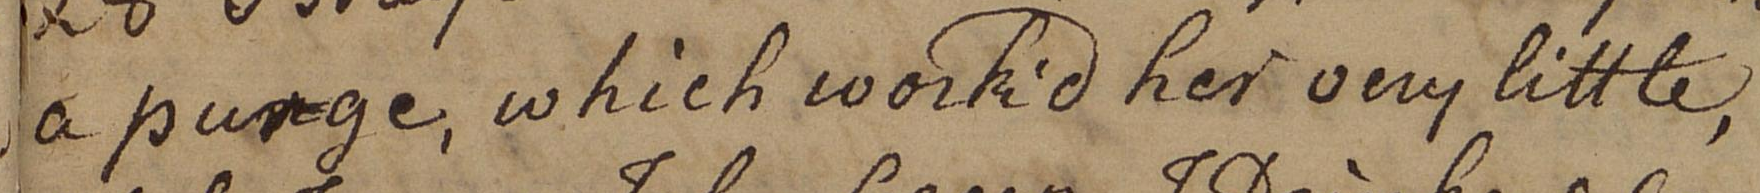a purge, which work'd her very little,
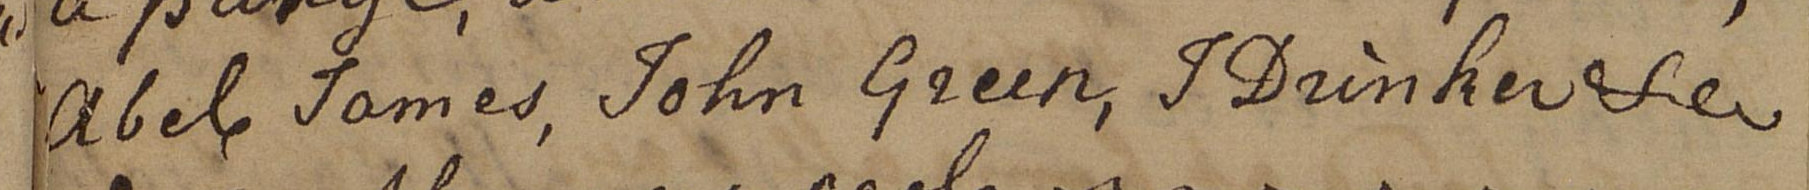Abel James, John Green, I Drinker &c
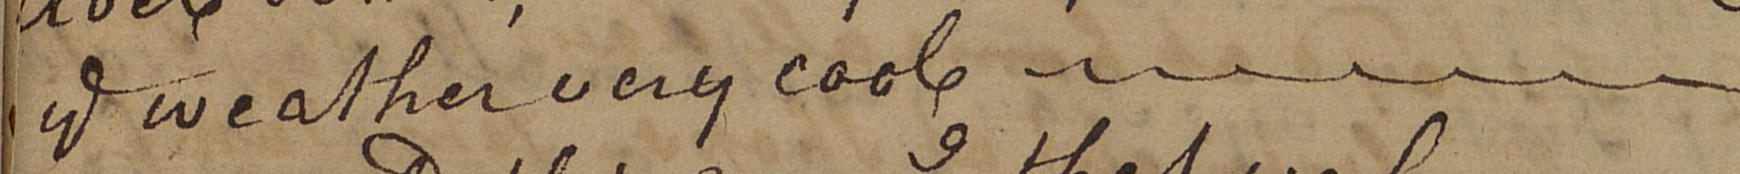y^e weather very cool--
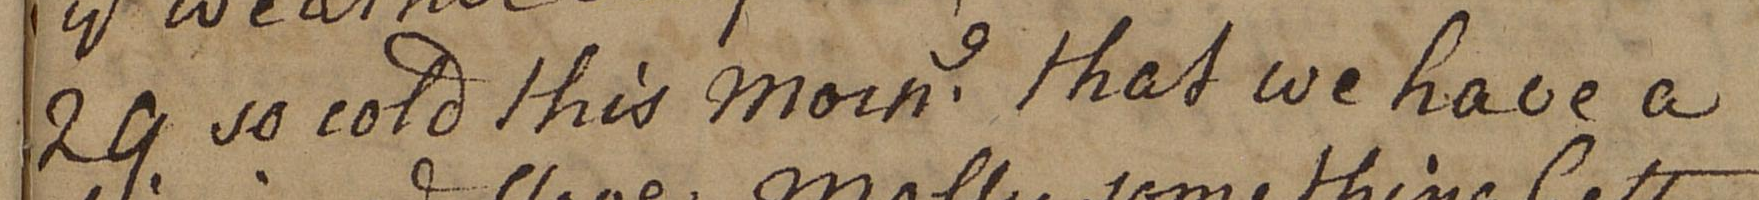29 so cold this morn^g. that we have a
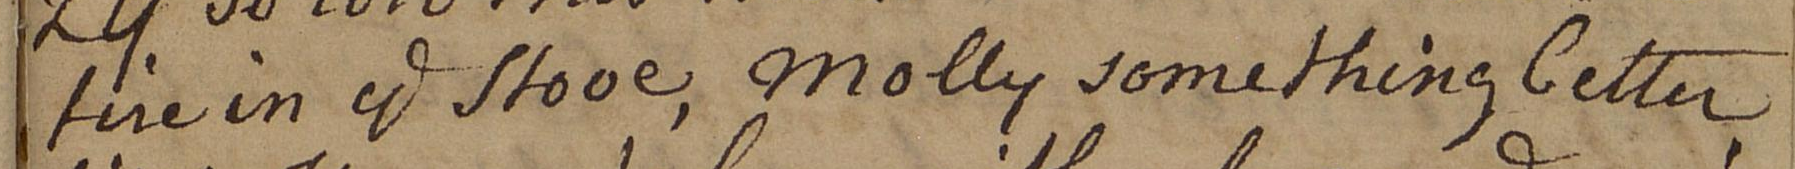fire in y^e stove, Molly something better
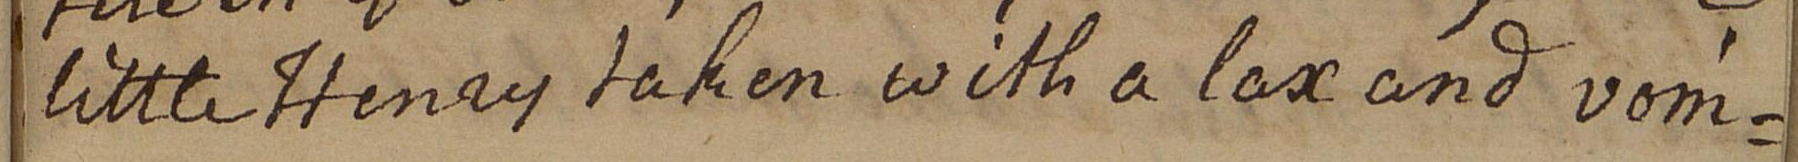little Henry taken with a lax and vom-
